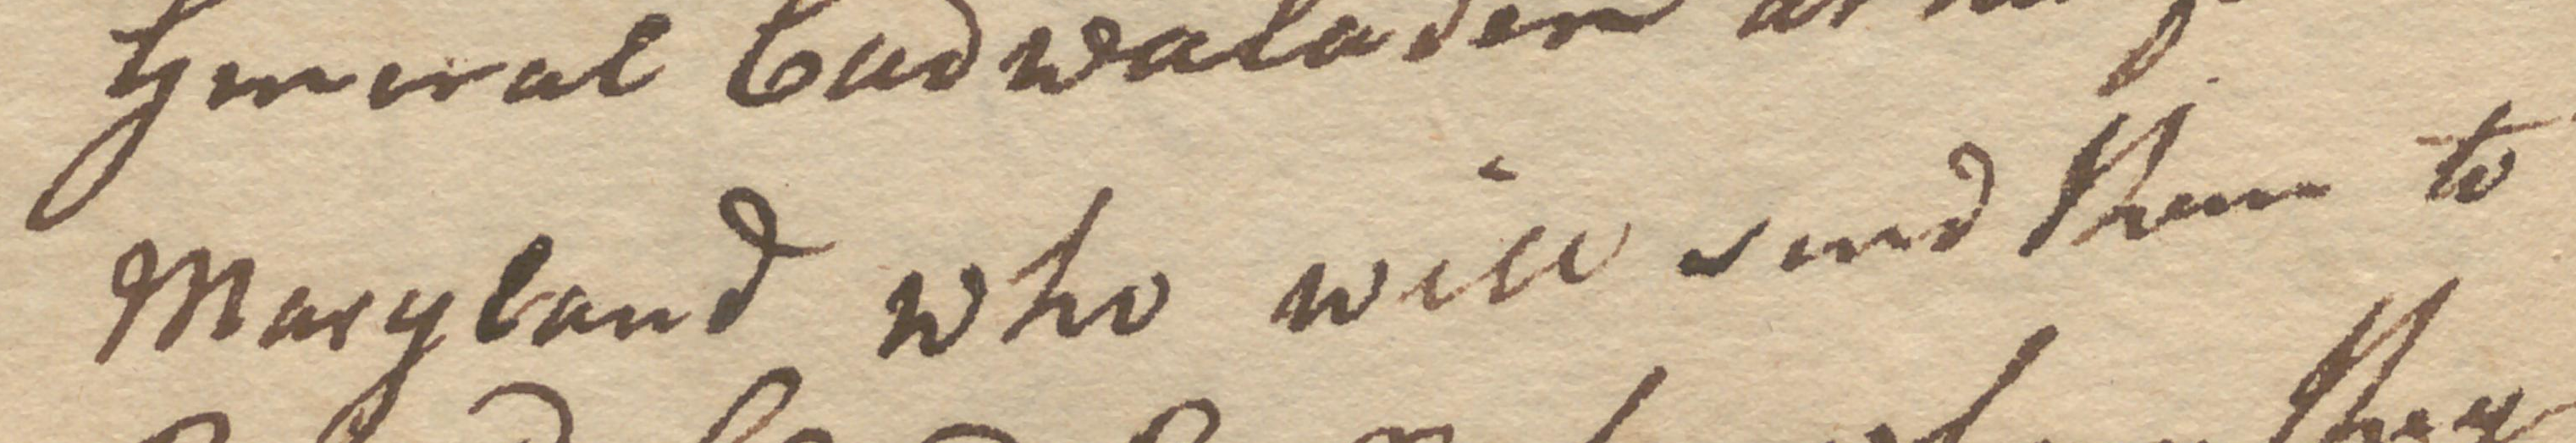Maryland who will send them to
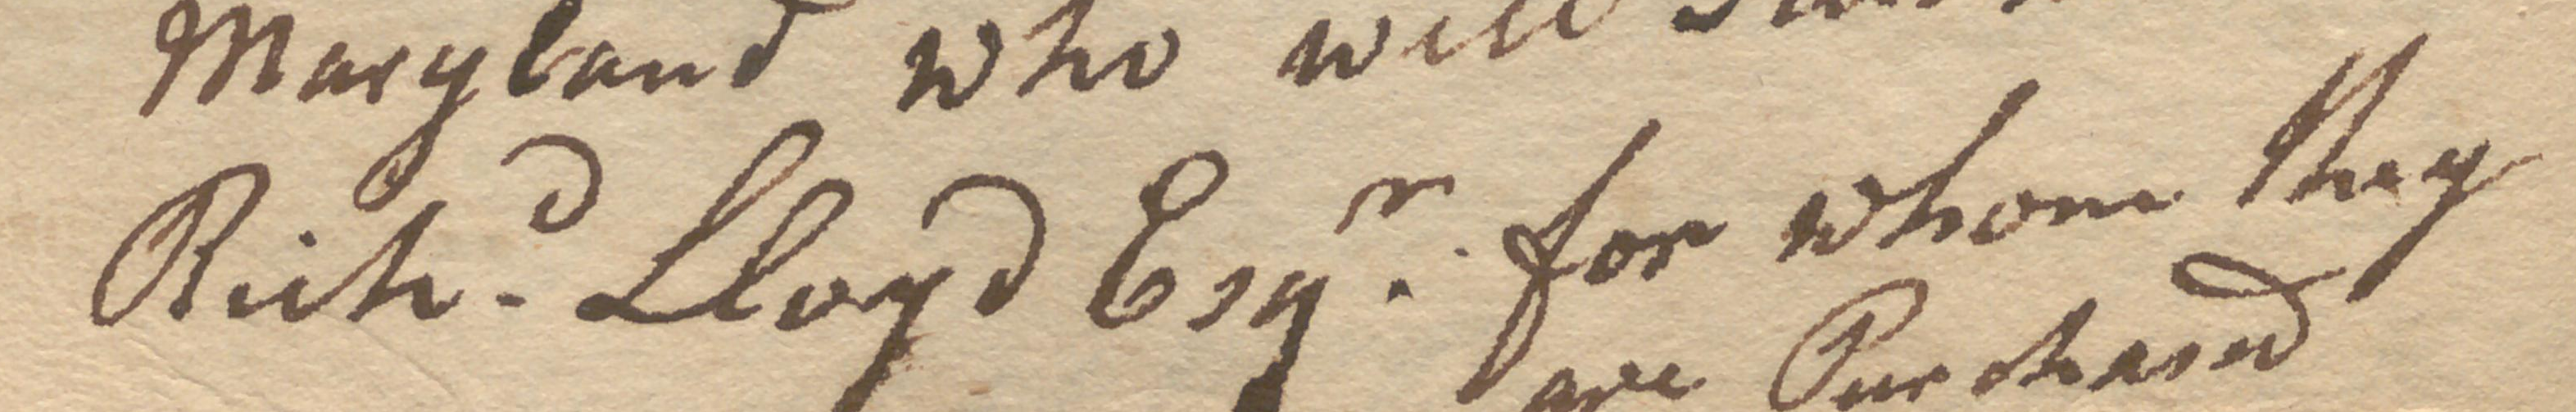Rich^d. Lloyd Esq^r. for whom they
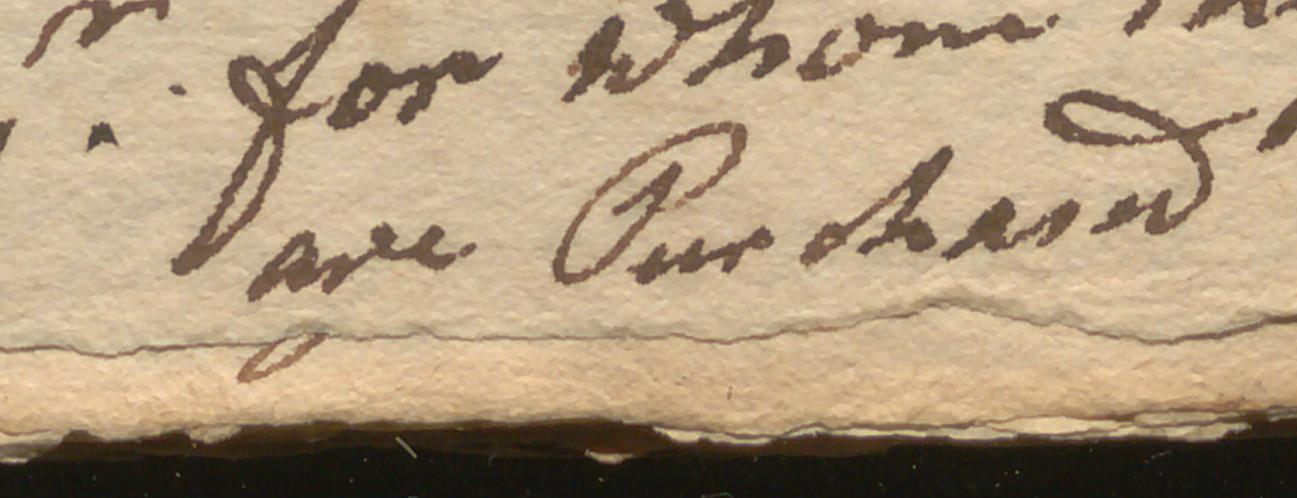are Purchased
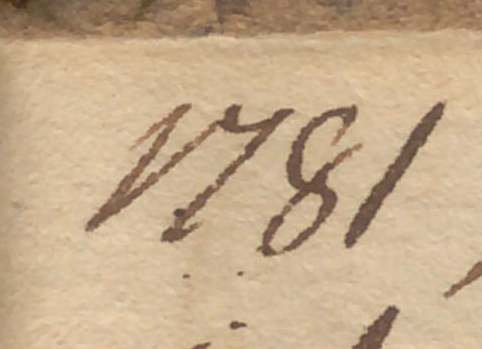1781
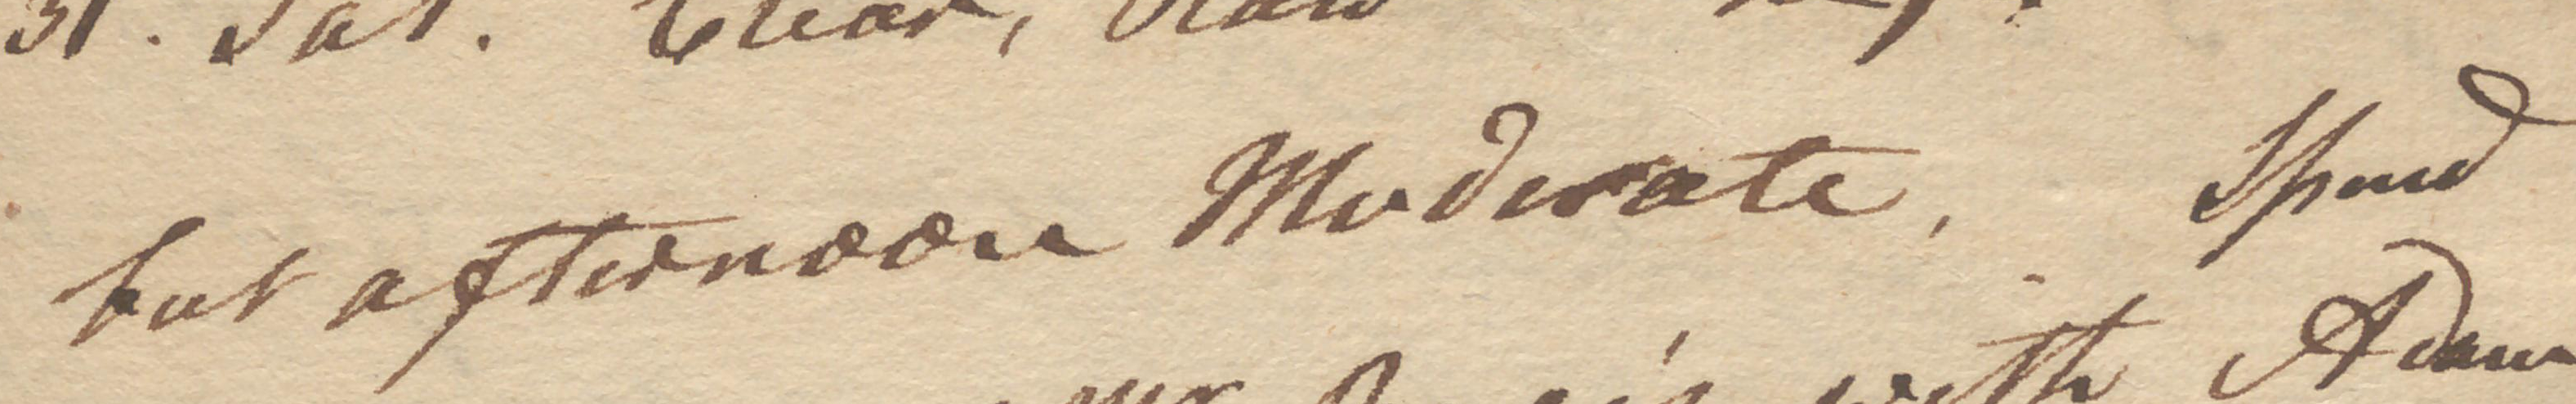but afternoon Moderate, Spend
